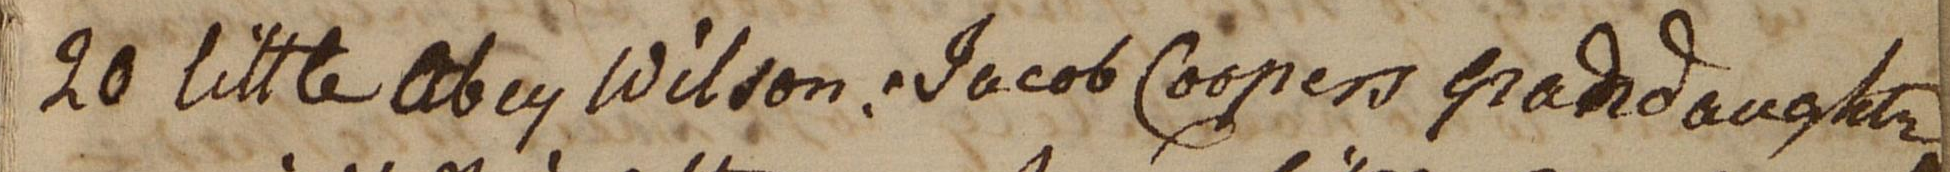20 little Abey Wilson: Jacob Coopers granddaughter
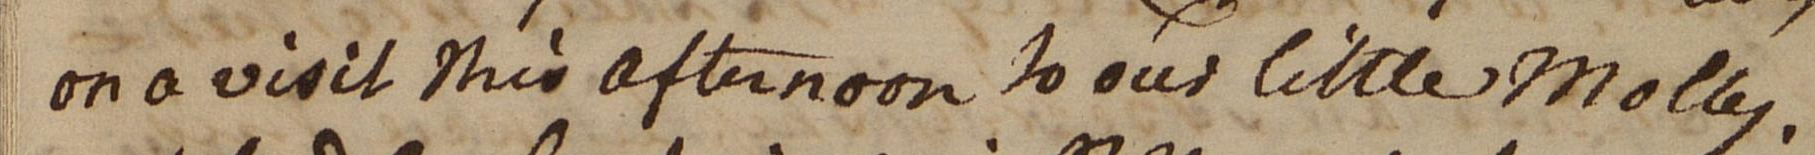on a visit this afternoon to our little Molly,
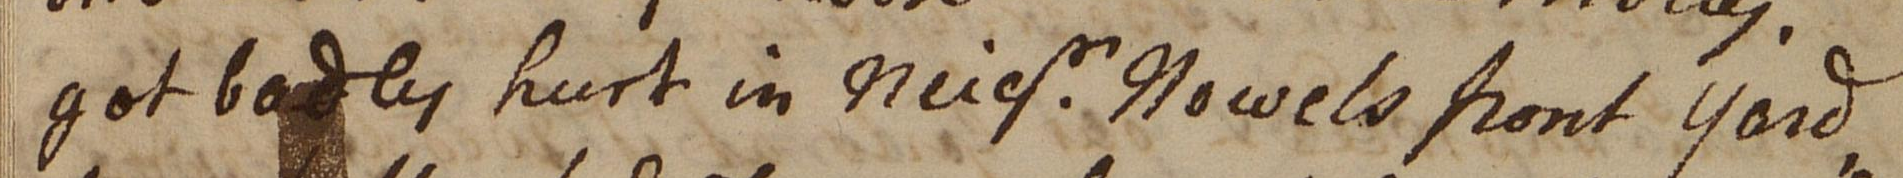get badly hurt in Neigh^r. Howels front yard
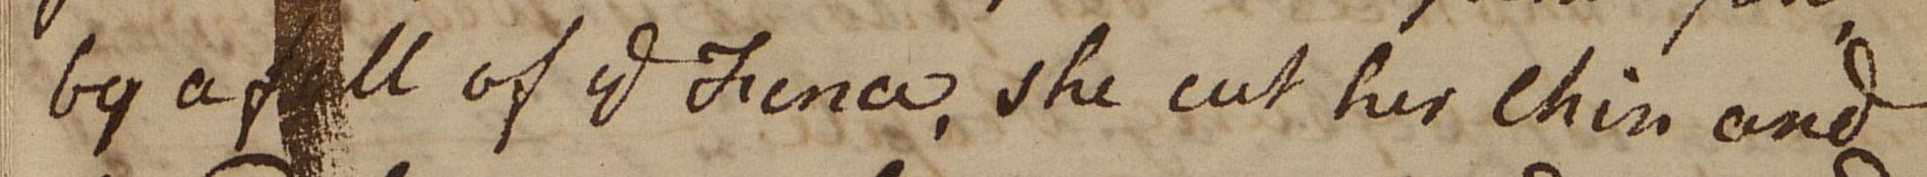by a full of y^e Fence, she cut her chin and
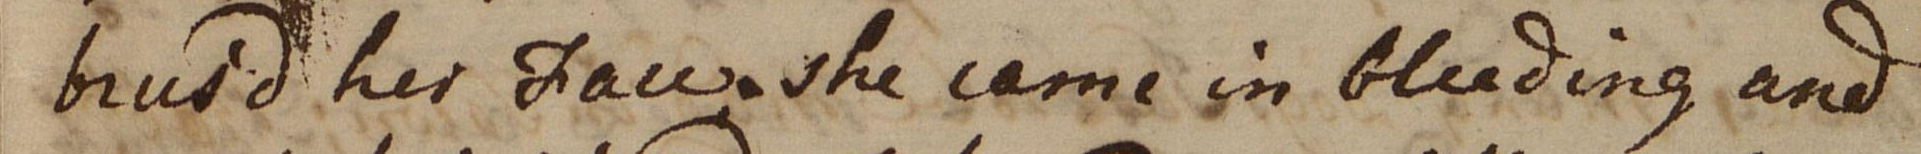brus'd her Face, she came in bleeding and
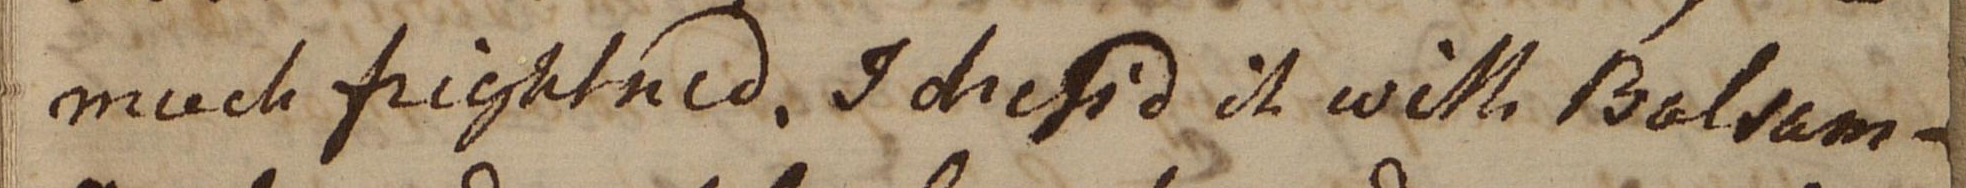much frightned. I dress'd it with Balsam-
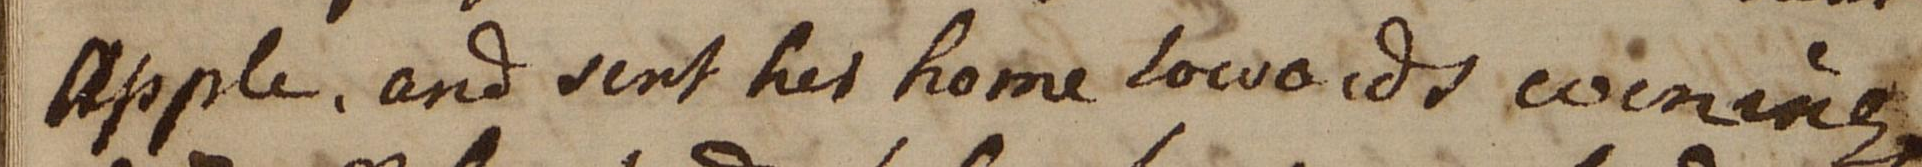Apple, and sent her home towards evening
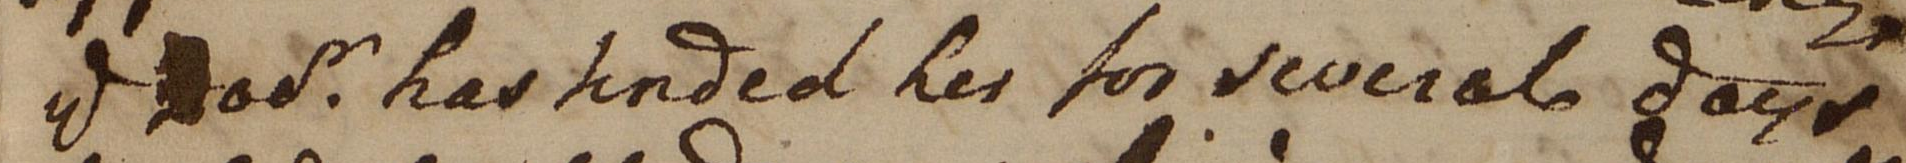y^e Doc^r. has tended her for several days
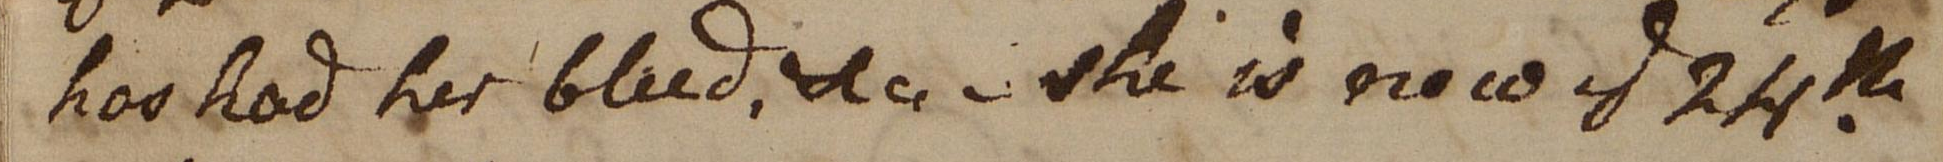has had her bleed, &c- she is now y^e 24^th
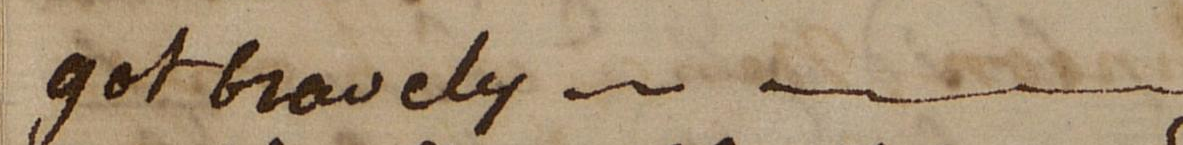got bravely--
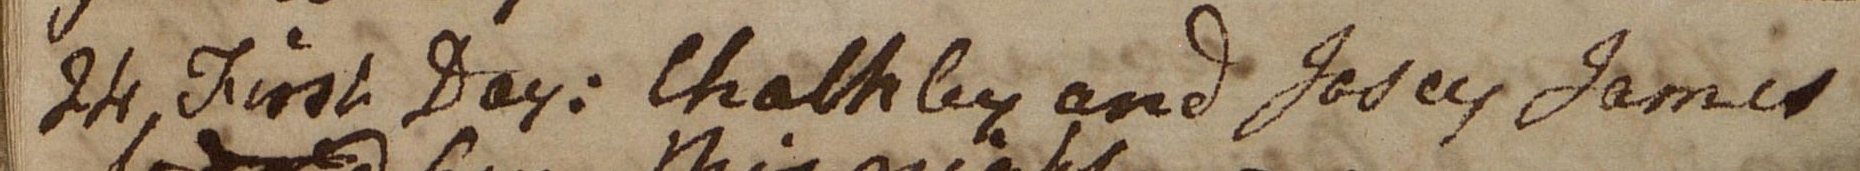24, Fist Day: Chalkley and Josey James
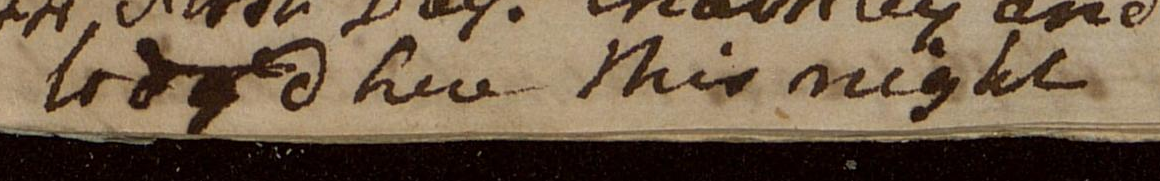lodg'd here this night
